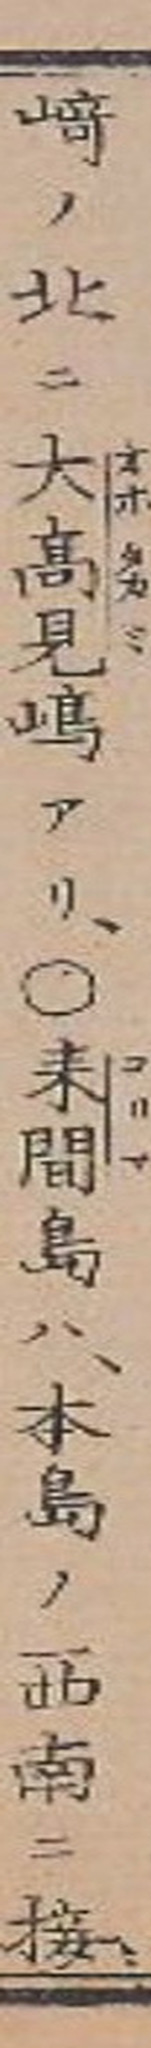崎ノ北ニ大高見島アリ、○来間島ハ、本島ノ西南ニ接
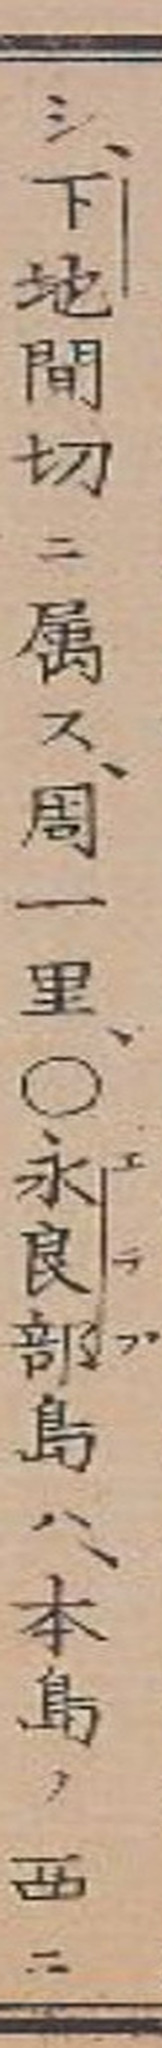シ、下地間切ニ属ス、周一里、○永良部島ハ、本島ノ西ニ
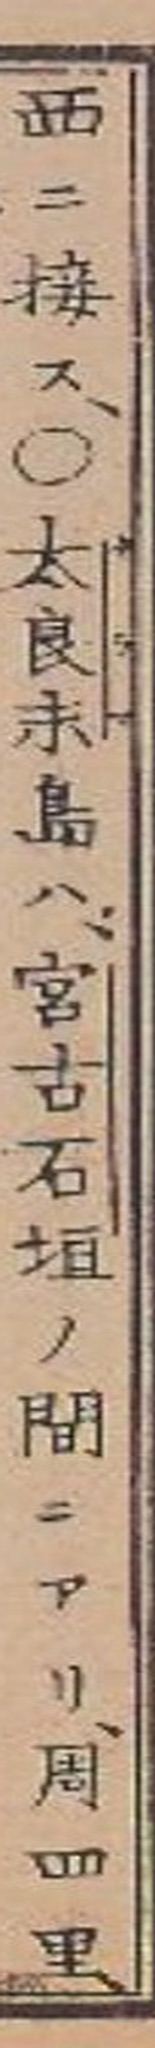西ニ接ス、○太良末島ハ、宮古石垣ノ間ニアリ、周四里、
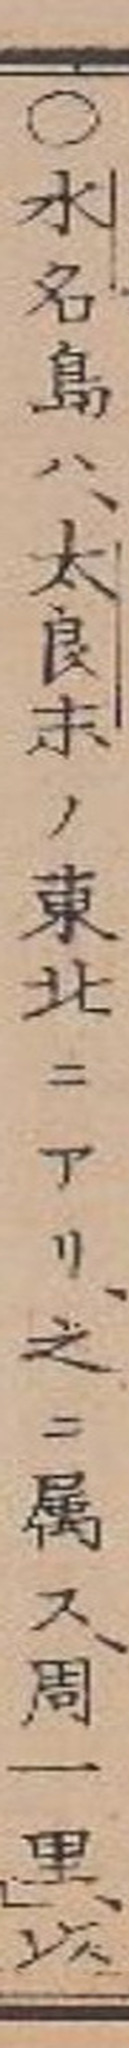○水名島ハ、太良末ノ東北ニアリ、之ニ属ス、周一里、」以
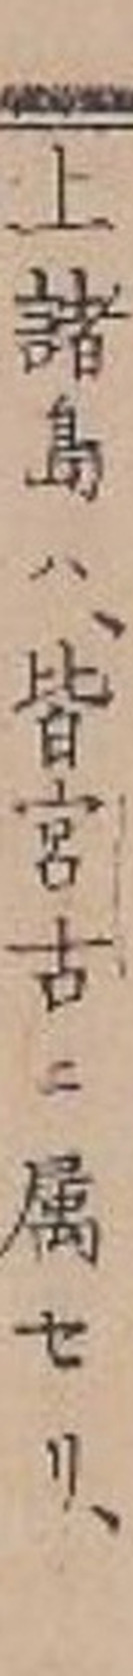上諸島ハ、皆宮古ニ属セリ、
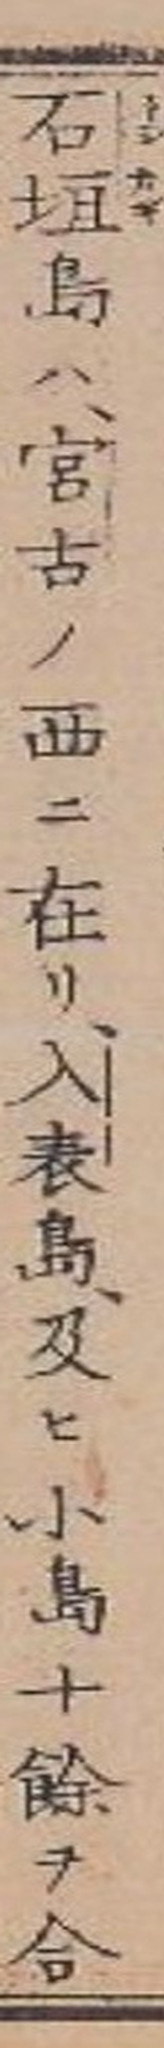石垣島ハ、宮古ノ西ニ在リ、入表島、及ヒ小島十余ヲ合
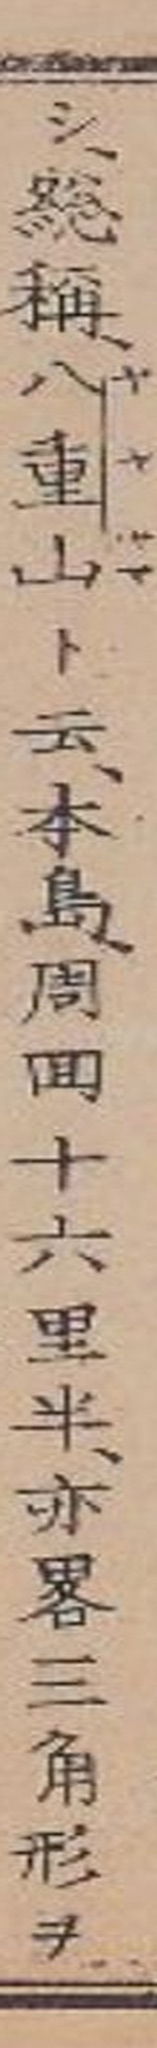シ、総称、八重山ト云、本島、周回十六里半、亦略三角形ヲ
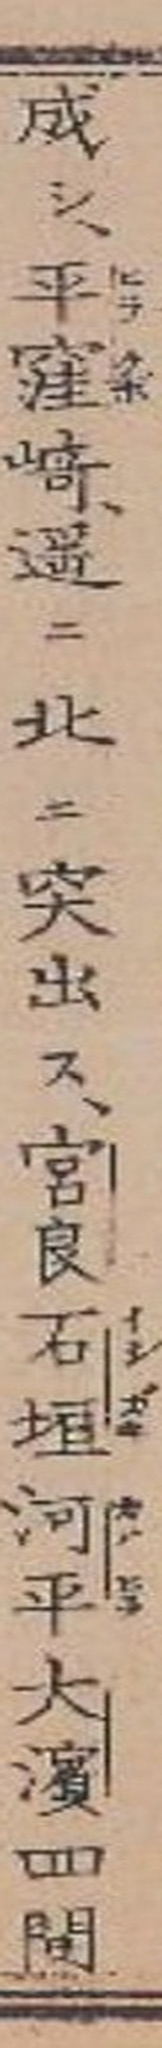成シ、平窪崎、遥ニ北ニ突出ス、宮良石垣河平大浜四間
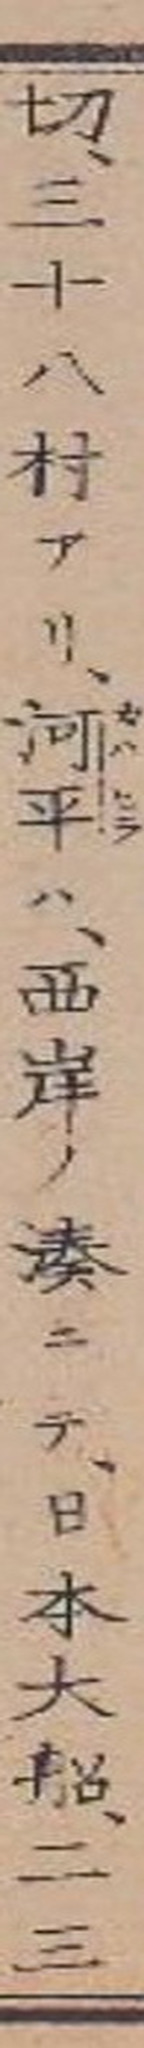切、三十八村アリ、河平ハ、西岸ノ湊ニテ、日本大船、二三
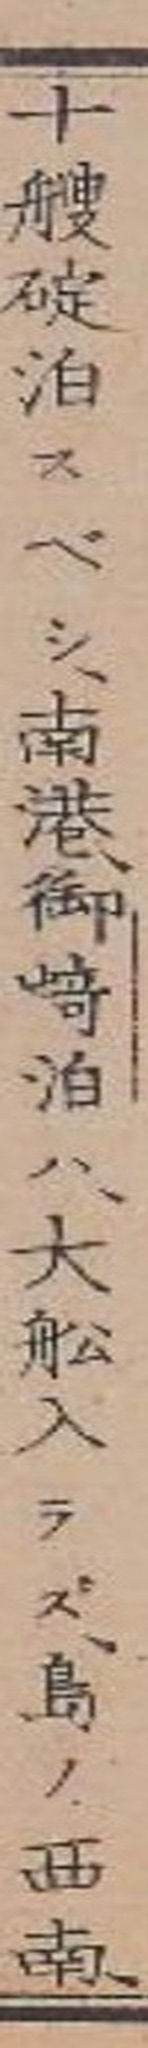十艘碇泊スベシ、南港、御崎泊ハ、大船入ラズ、島ノ西南、
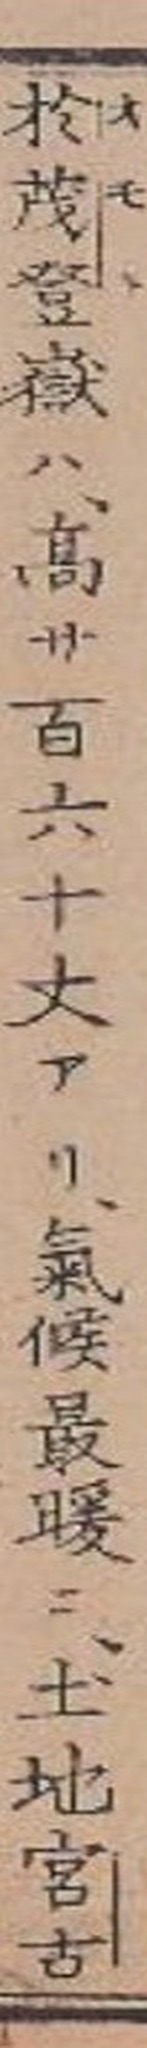於茂登岳ハ、高サ百六十丈アリ、気候最暖ニ、土地宮古
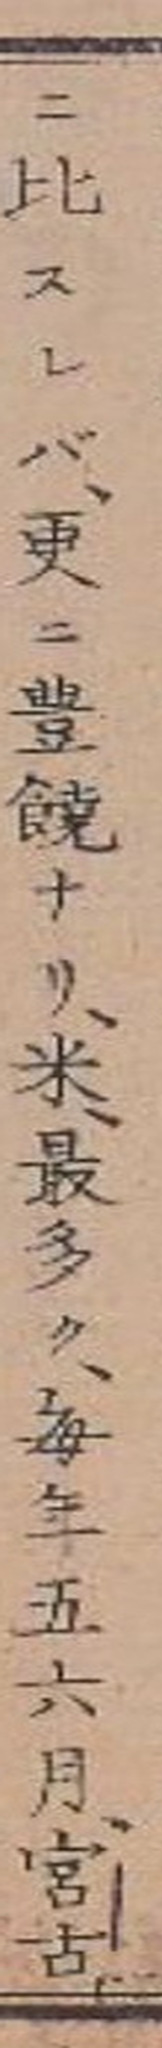ニ比スレバ、更ニ豊饒ナリ、米、最多ク、毎年五六月、宮古
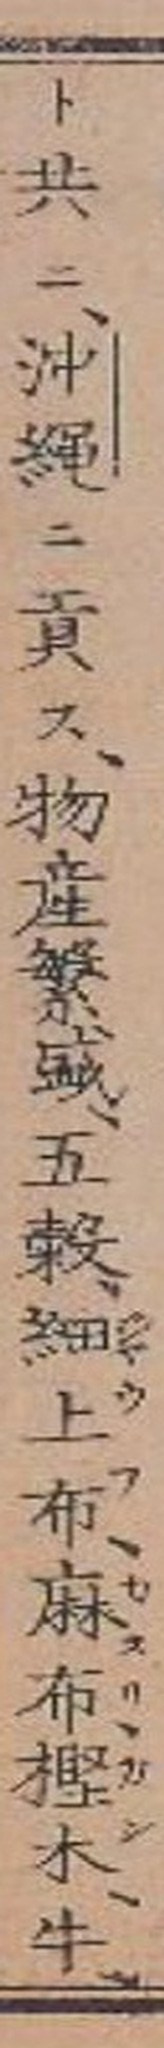ト共ニ、沖縄ニ貢ス、物産繁盛、五穀、細上布、麻布、樫木、牛、

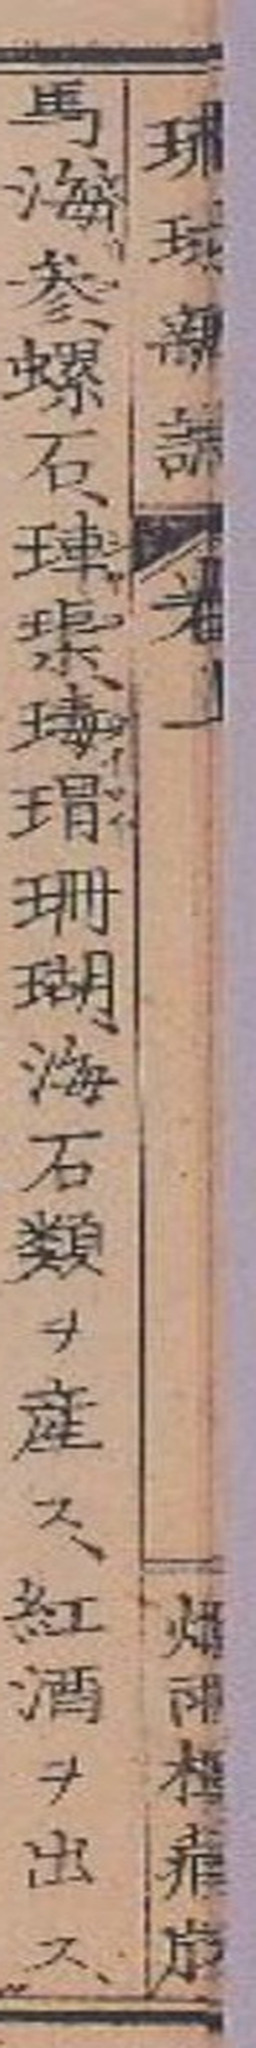馬、海参、螺石、、瑇瑁珊瑚、海石類ヲ産ス、紅酒ヲ出ス、
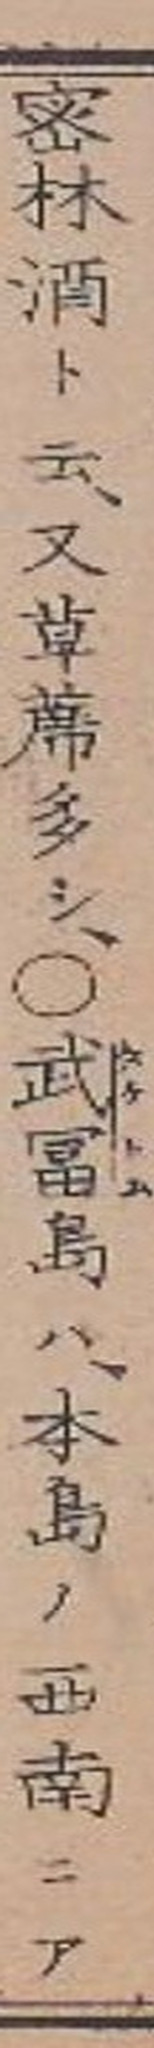密林酒ト云、又草蓆多シ、○武富島ハ、本島ノ西南ニア
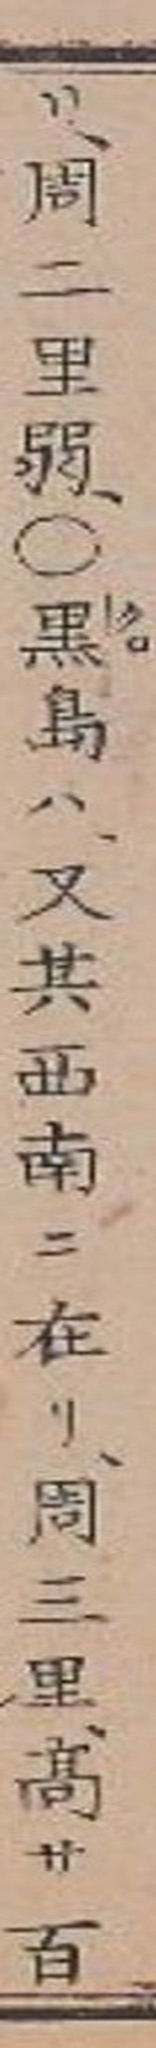リ、周二里弱、○黒島ハ、又其西南ニ在リ、周三里、高サ百
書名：琉球新誌 巻上
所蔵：University of the Ryukyus Library
